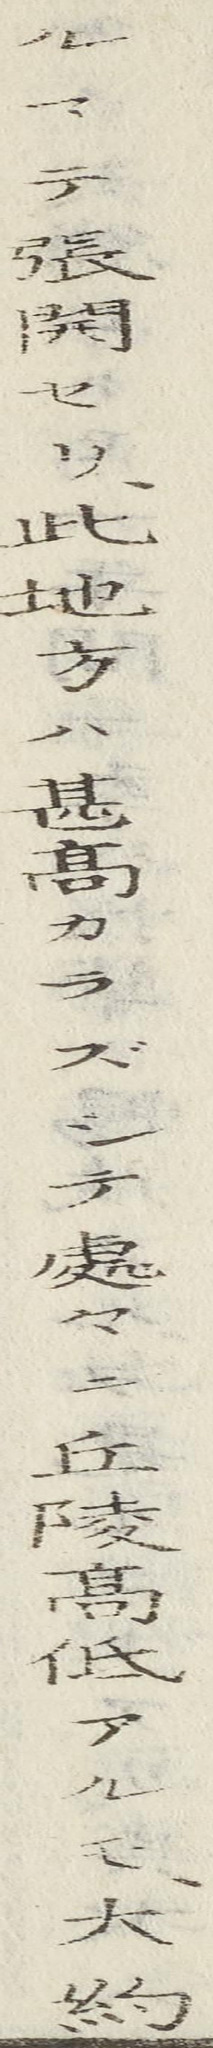ルマテ張開セリ、此地方ハ甚高カラズシテ処々ニ丘陵高低アルモ、大約
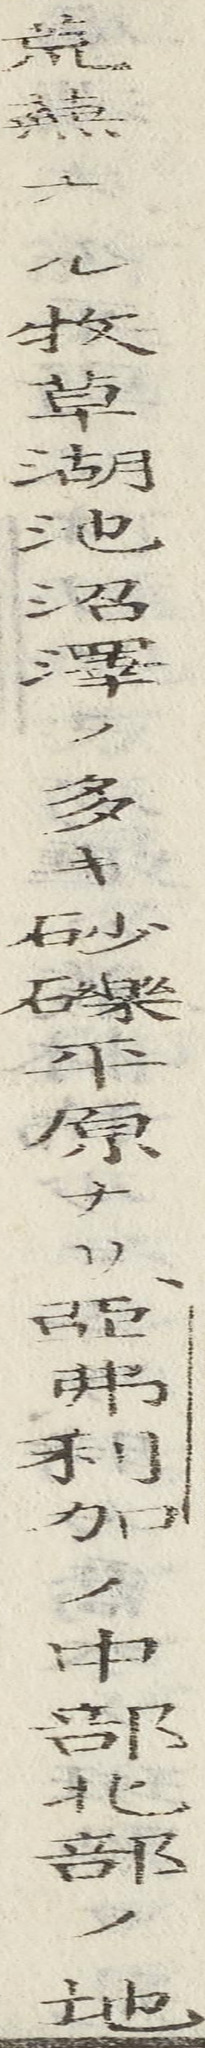荒無ナル牧草湖池沼沢ノ多キ砂礫平原ナリ、阿弗利加ノ中部北部ノ地
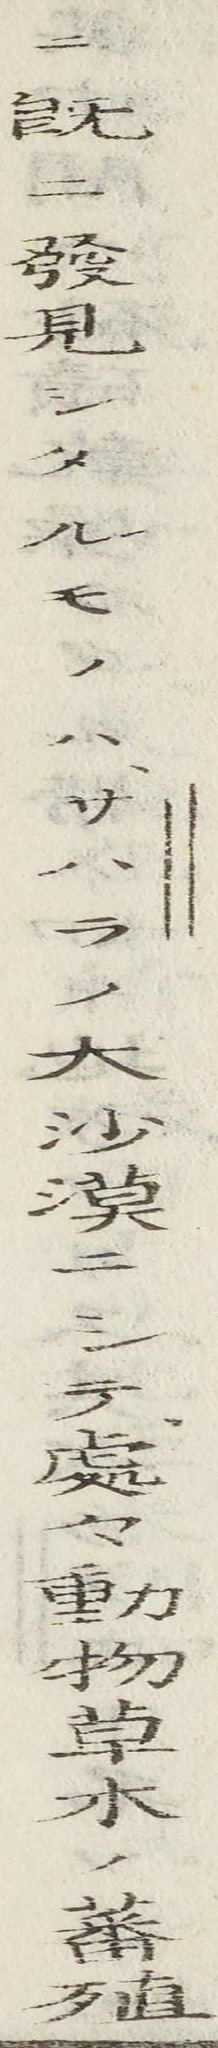ニ既ニ発見シタルモノハ、サハラノ大沙漠ニシテ、処々動物草木ノ蕃殖
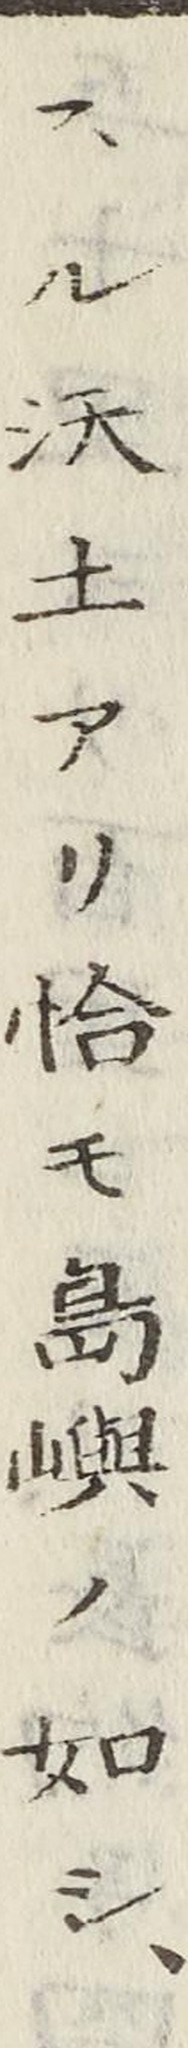スル沃土アリ恰モ島嶼ノ如シ、
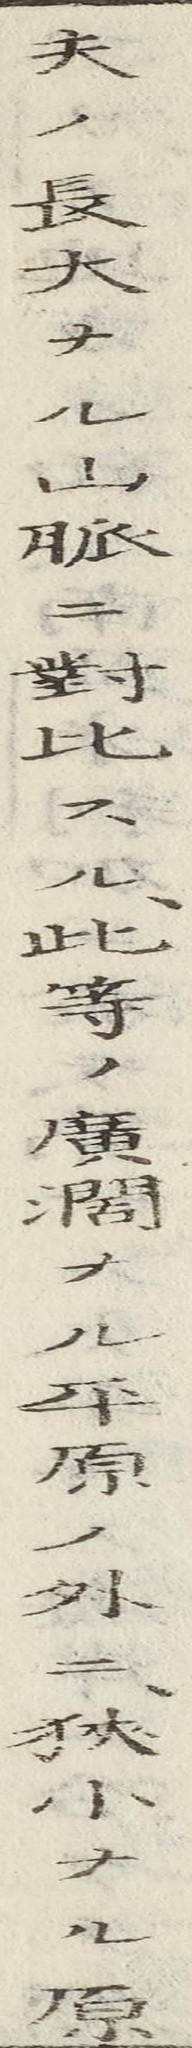夫ノ長大ナル山脈ニ対比スル、此等ノ広濶ナル平原ノ外ニ、狭小ナル原
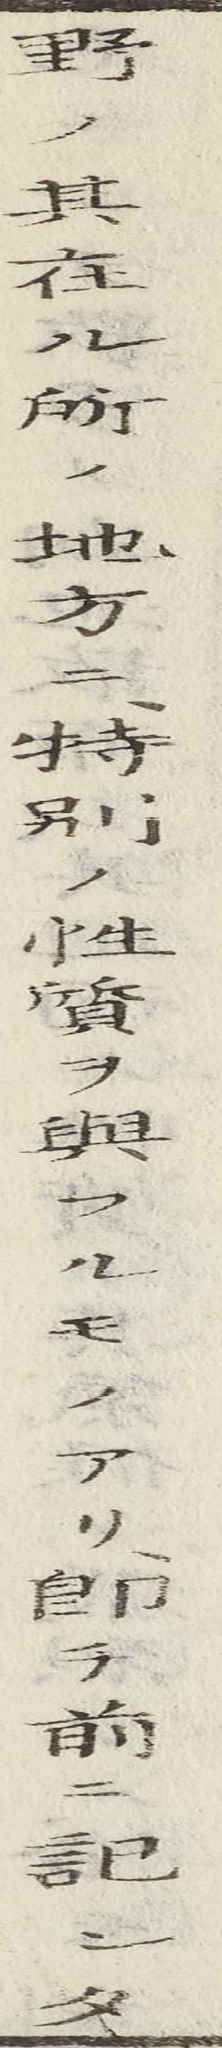野ノ其在ル所ノ地方ニ、特別ノ性質ヲ与フルモノアリ、即チ前ニ記シタ
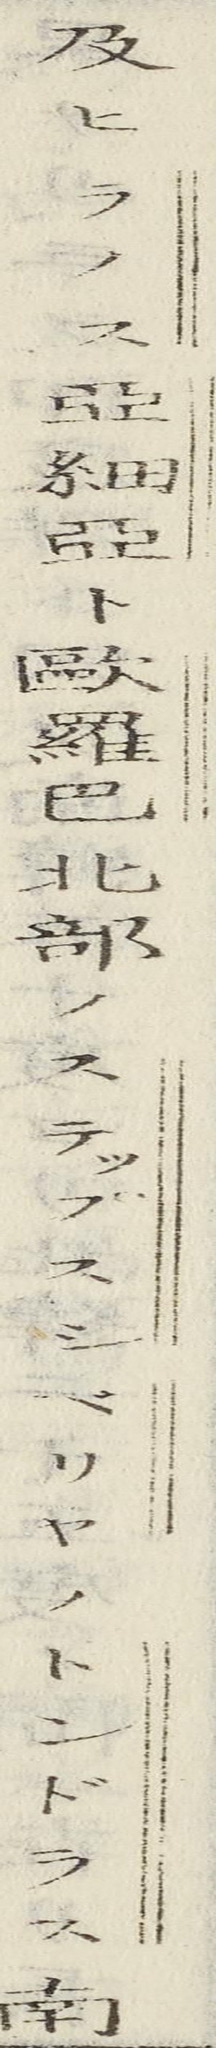及ヒラノス亜細亜ト欧羅巴北部ノステップスシベリヤノトンドラス南
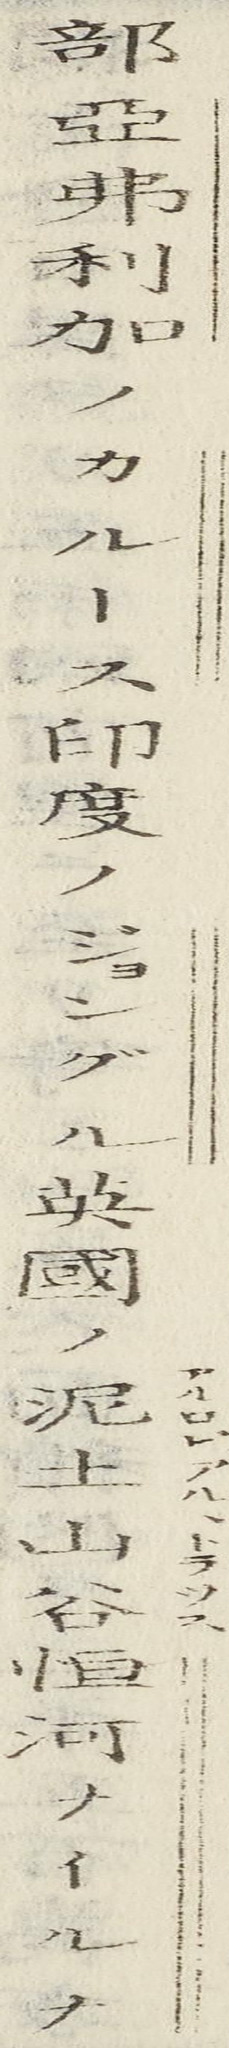部阿弗利加ノカルース印度ノジョングル英国ノ泥土山谷恒河ナイルナ
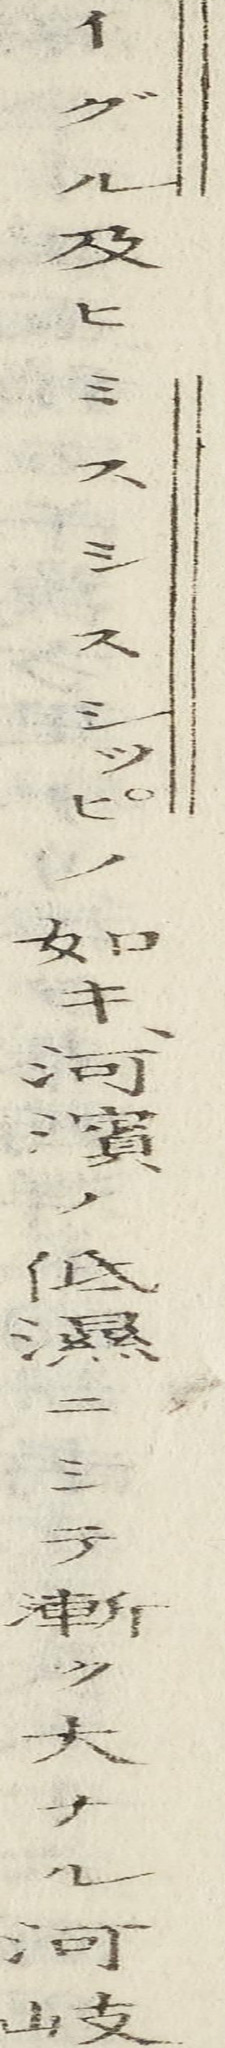イグル及ヒミスシスシッピノ如キ、河浜ノ低湿ニシテ漸ク大ナル河岐
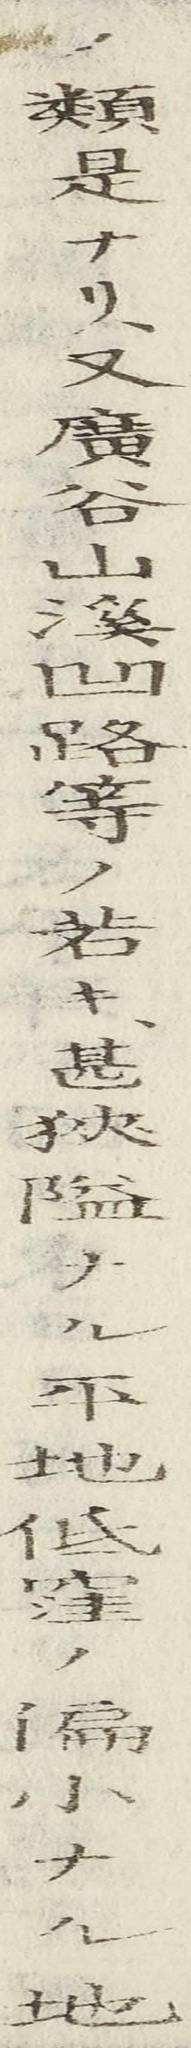ノ類是ナリ、又広谷山渓凹路等ノ若キ、甚狭隘ナル平地低窪ノ徧小ナル地
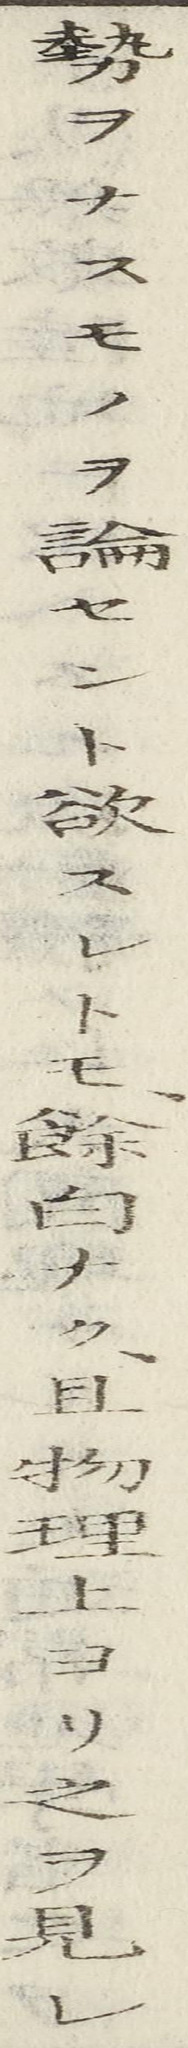勢ヲナスモノヲ論セント欲スレトモ、余白ナク、且物理上ヨリ之ヲ見レ
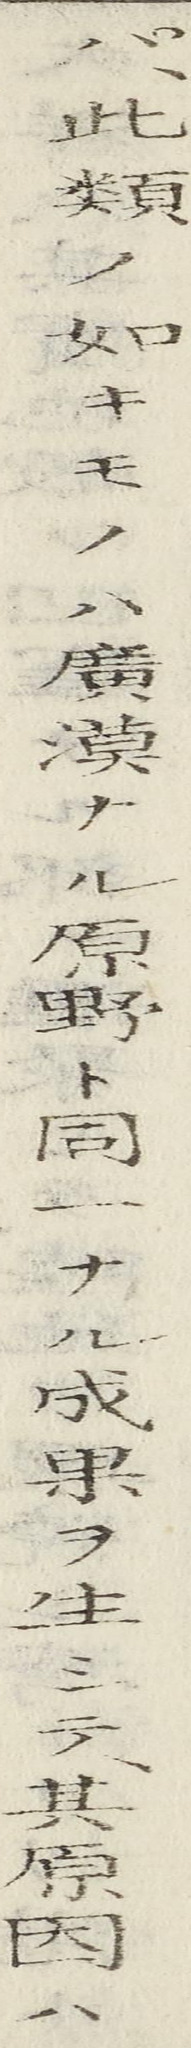バ、此類ノ如キモノハ広漠ナル原野ト同一ナル成果ヲ生シテ、其原因ハ
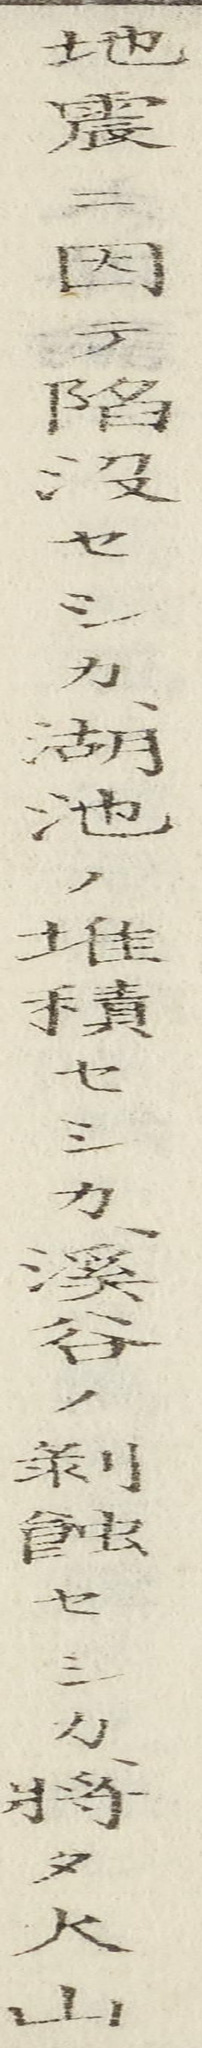地震ニ因テ陥没セシカ、湖池ノ堆積セシカ、渓谷ノ剥蝕セシカ、将タ火山
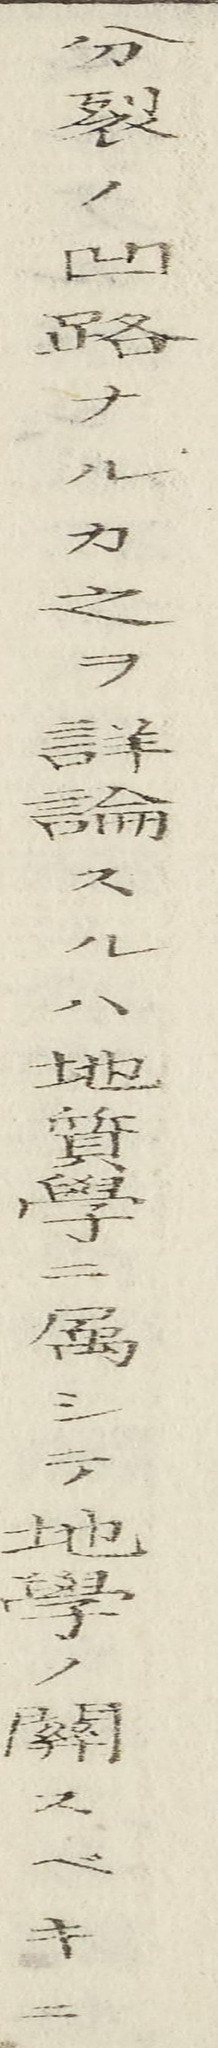分裂ノ凹路ナルカ之ヲ詳論スルハ地質学ニ属シテ地学ノ関スベキニ
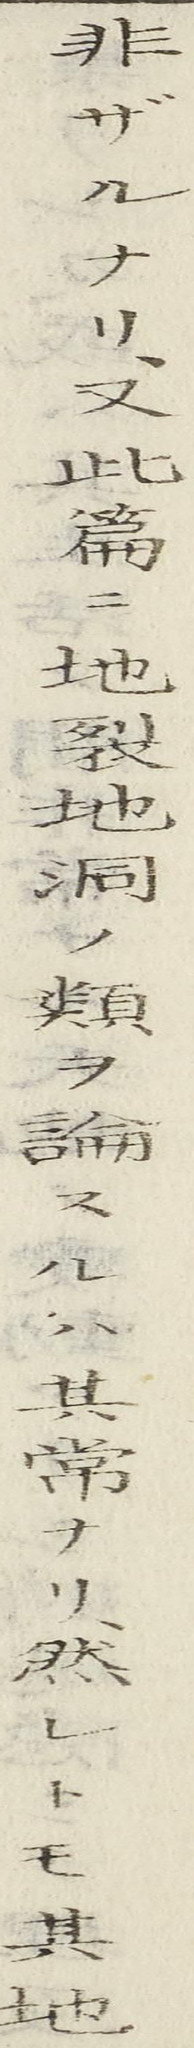非ザルナリ、又此篇ニ地裂地洞ノ類ヲ論スルハ其常ナリ、然レトモ其地
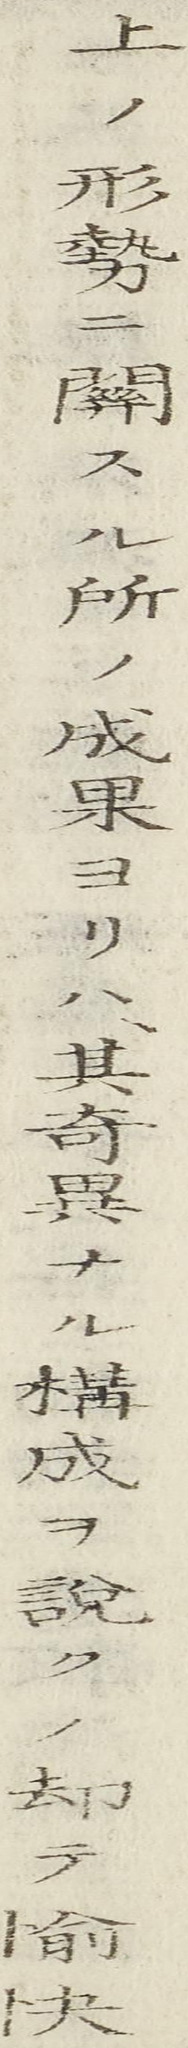上ノ形勢ニ関スル所ノ成果ヨリハ、其奇異ナル構成ヲ説クノ却テ愉快
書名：百科全書　地文學　全
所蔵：東京大学地震研究所図書室 Earthquake Research Institute Library, The University of Tokyo, JAPAN
